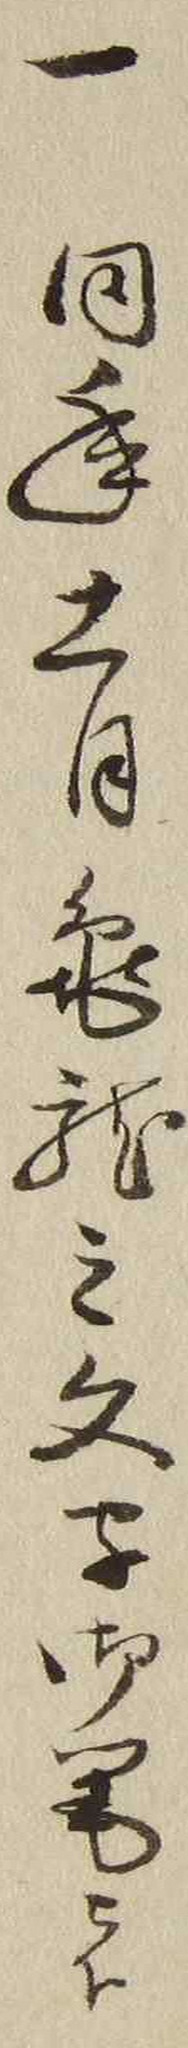一同年十一月亀龍之文字御筆被下
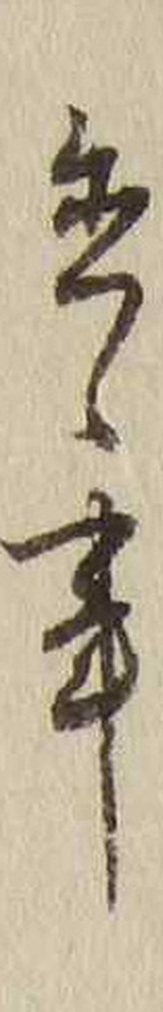置候事
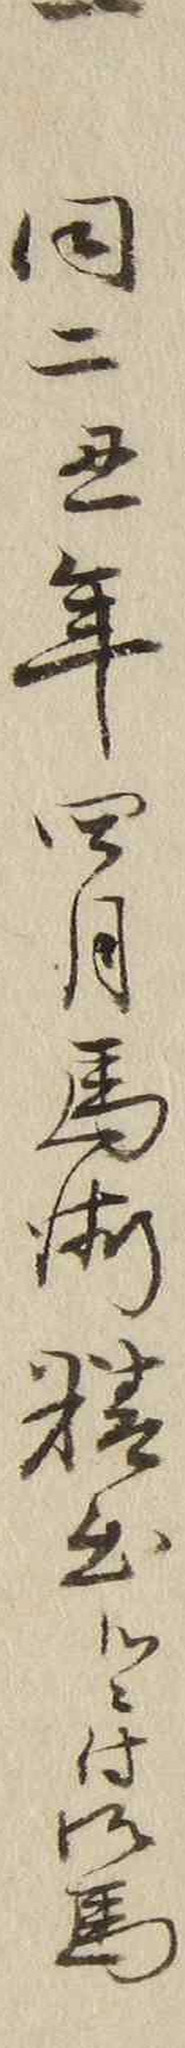一同二丑年四月馬術精出候ニ付御馬

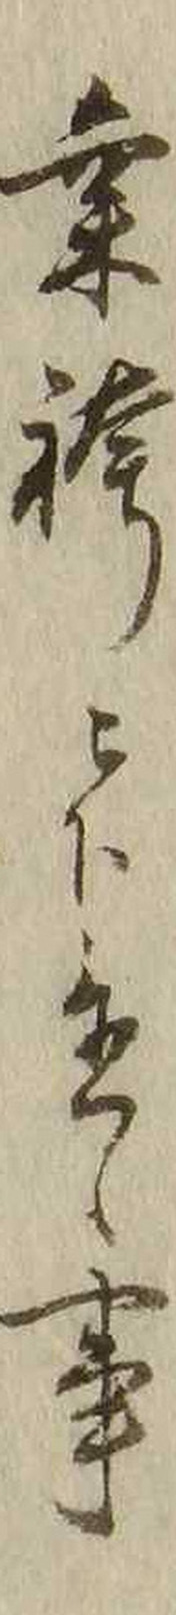乗袴被下置候事
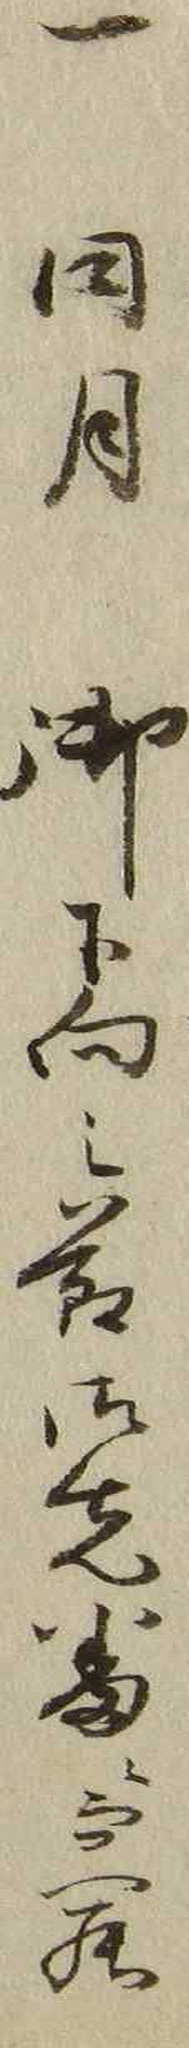一同月御下向之節御先番ニ而罷
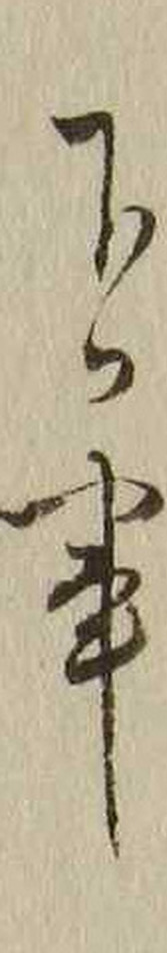下候事
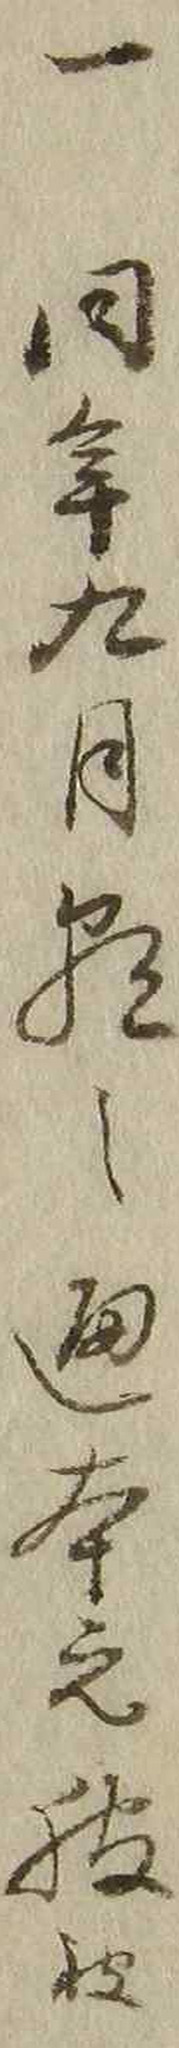一同年九月願之通本元服被
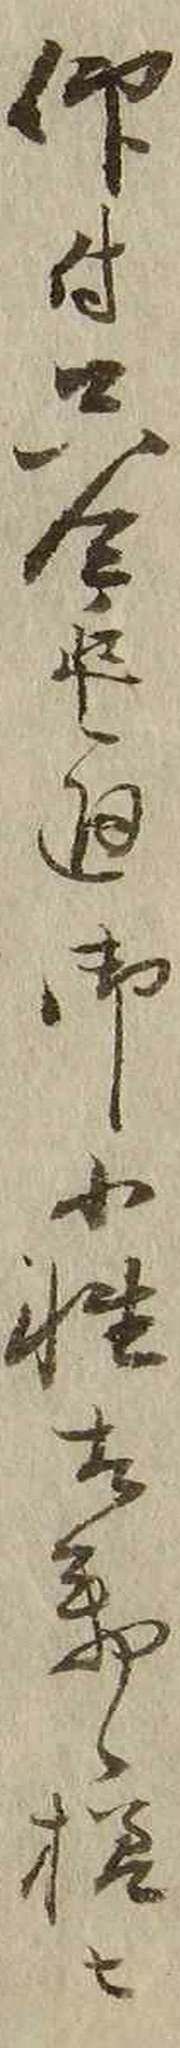仰付只今迄之通御小性相勤候様被
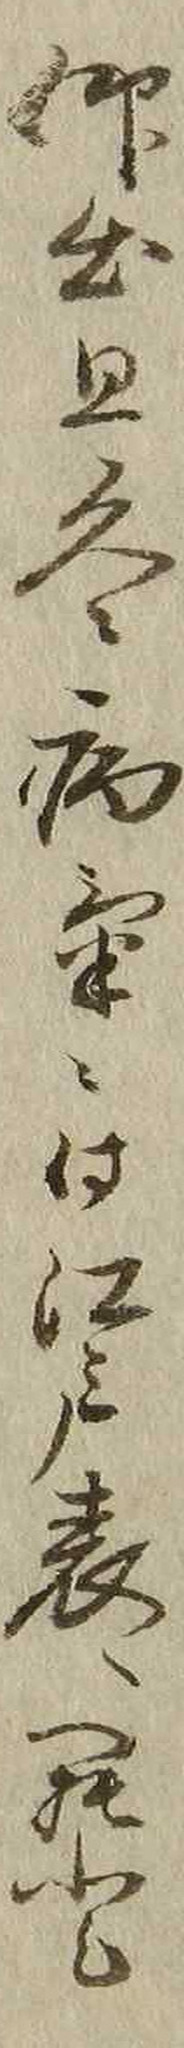仰出且久々病気ニ付江戸表へ罷登
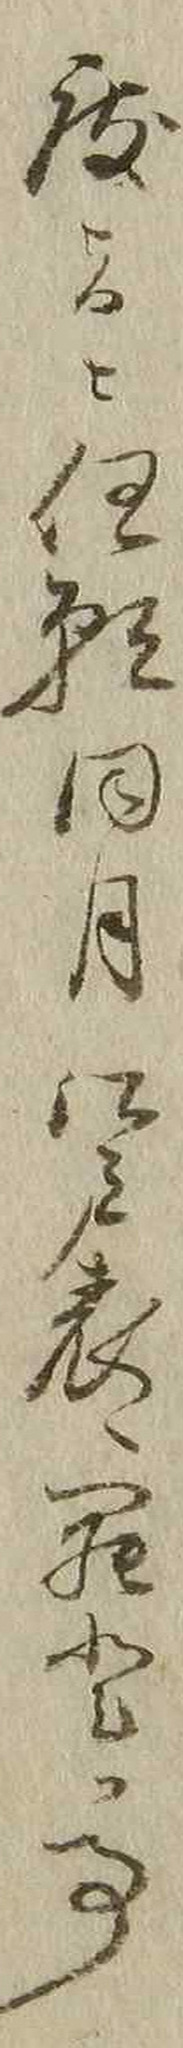度旨被任願同月江戸表へ罷登候事
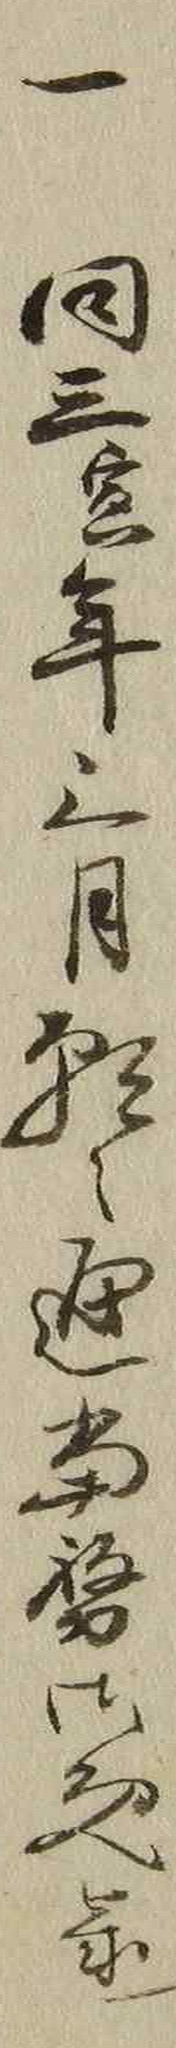一同三寅年三月願之通当務御免被成
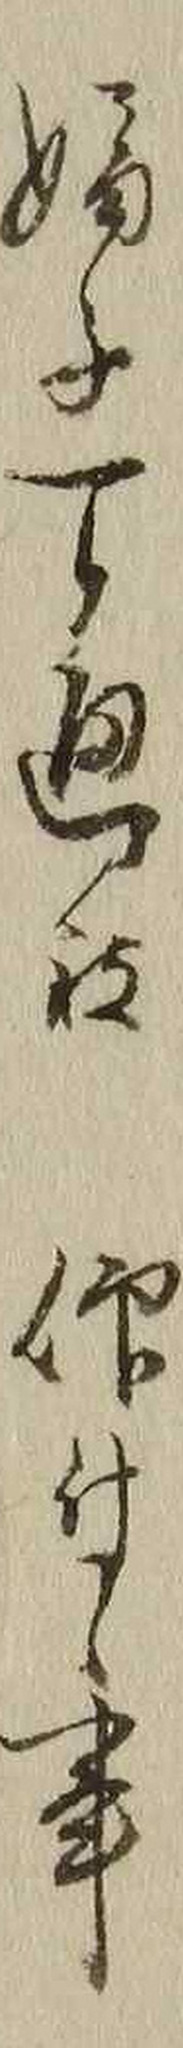嫡子一ヶ通被仰付候事
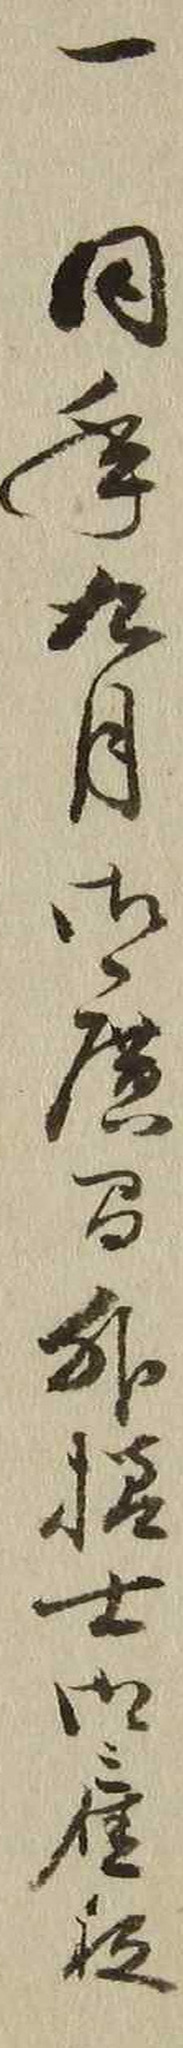一同年九月御広間外様士御雇被
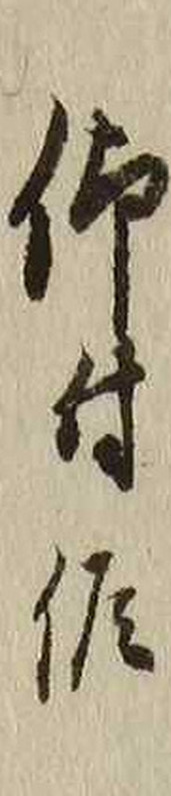仰付候
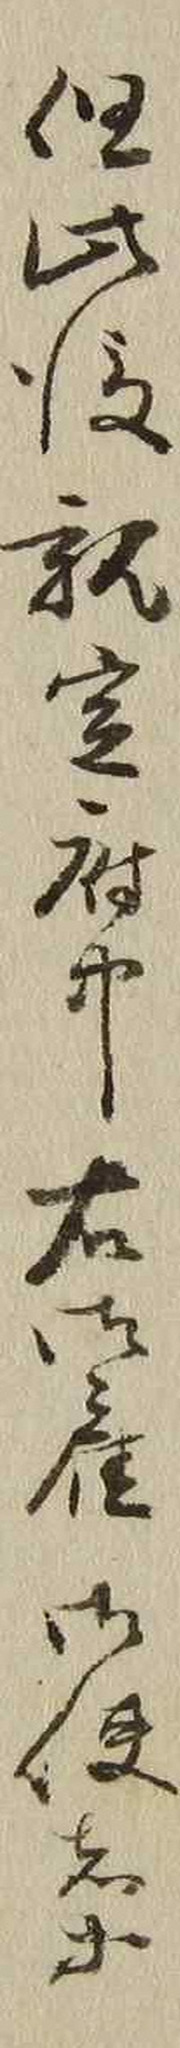但此後祝定府中右御雇御使者等
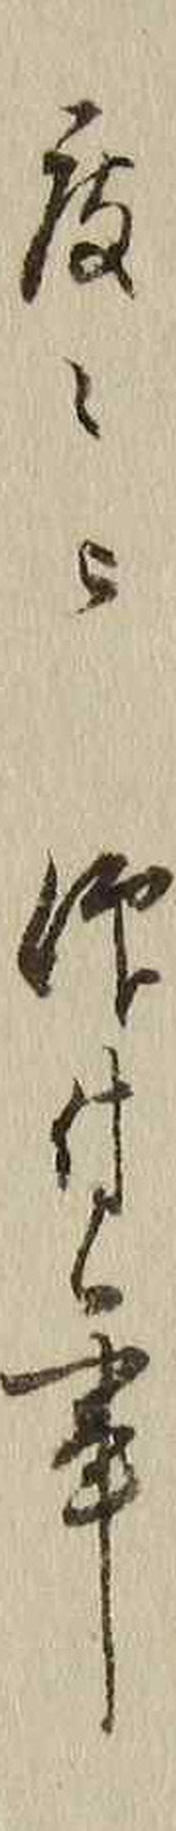度々被仰付候事
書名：諸士系譜　巻之225　ま之部6
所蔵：会津若松市立会津図書館
